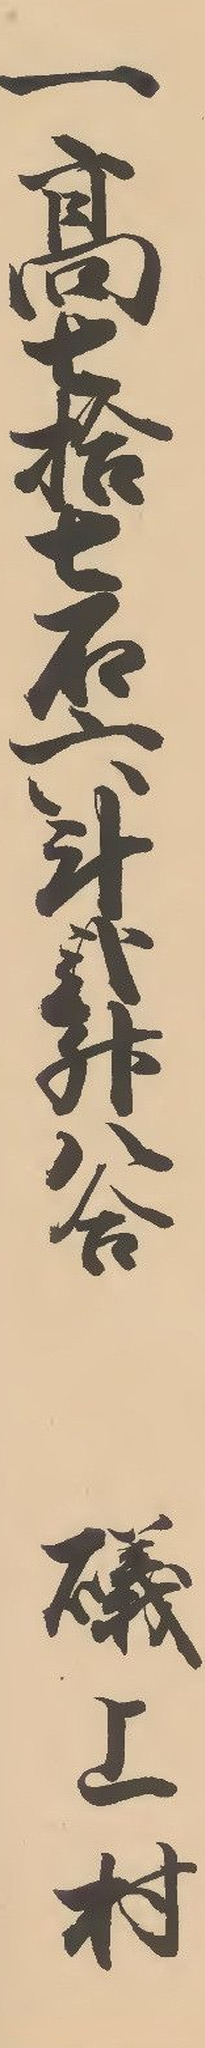一高七拾七石六斗弐升八合磯上村
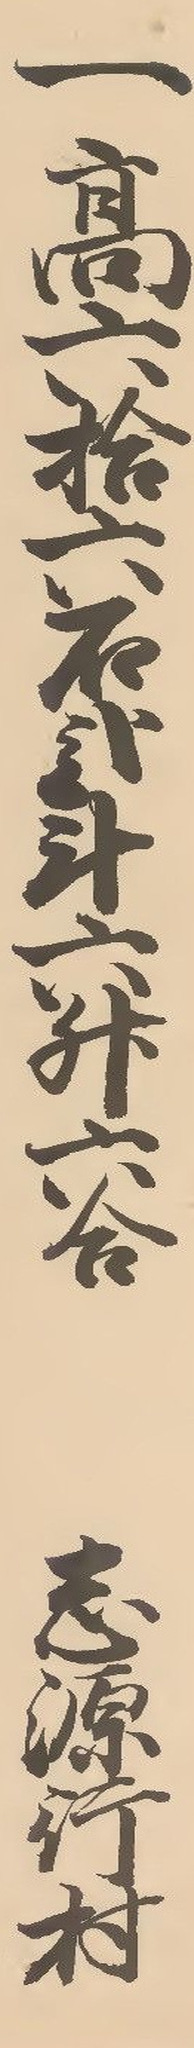一高六拾六石弐斗六升六合志源行村
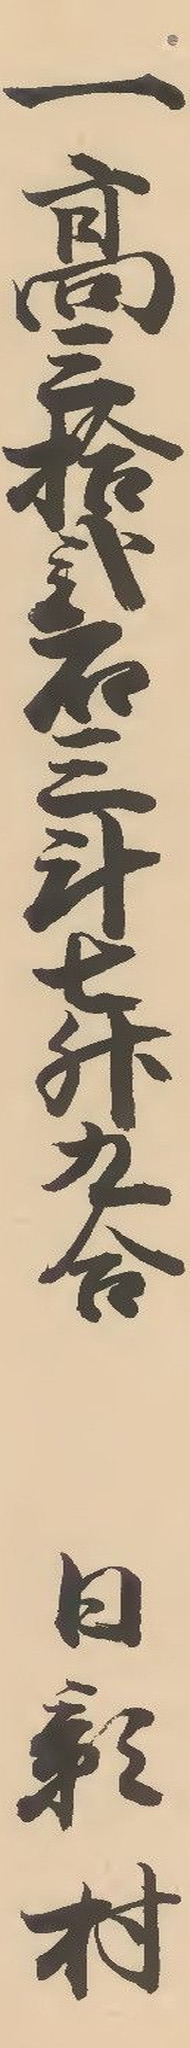一高三拾弐石三斗七升九合日影村

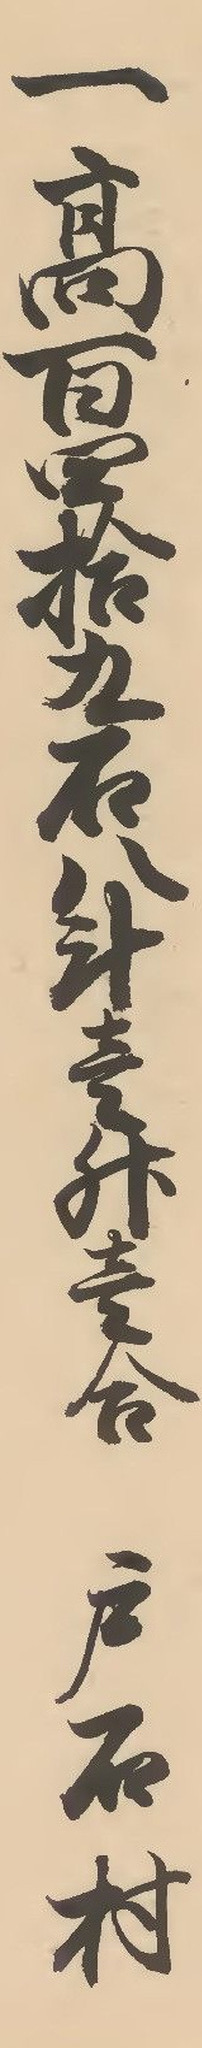一高百四拾九石八斗壱升壱合戸石村
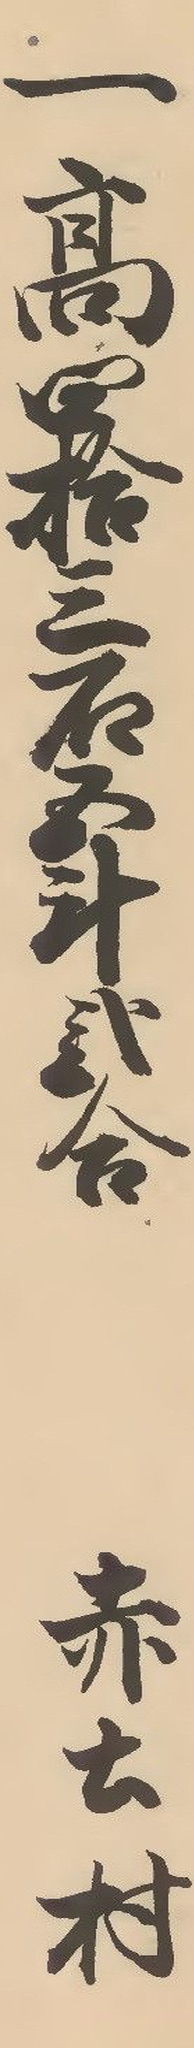一高四拾三石五斗弐合赤土村
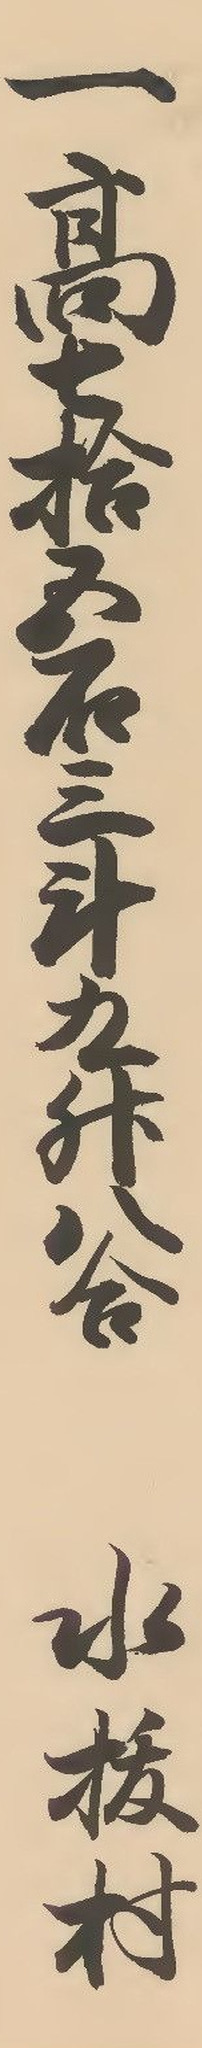一高七拾五石三斗九升八合水抜村
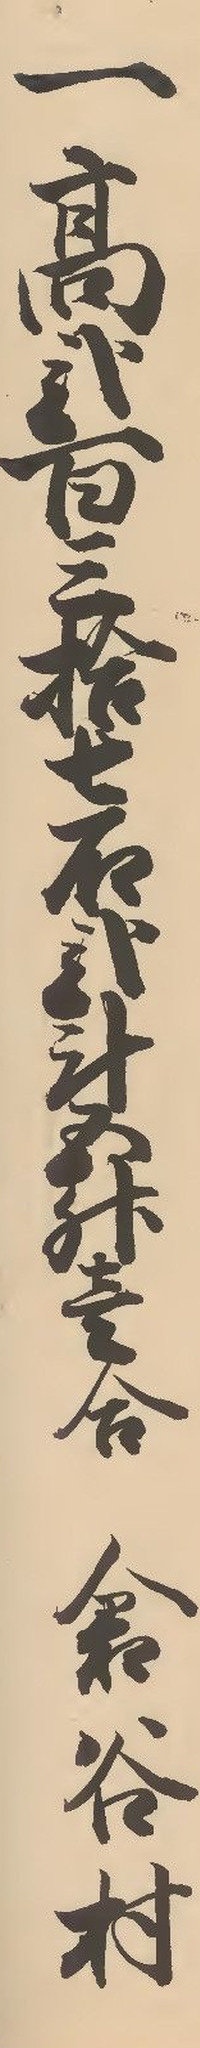一高弐百三拾七石弐斗五升壱合倉谷村
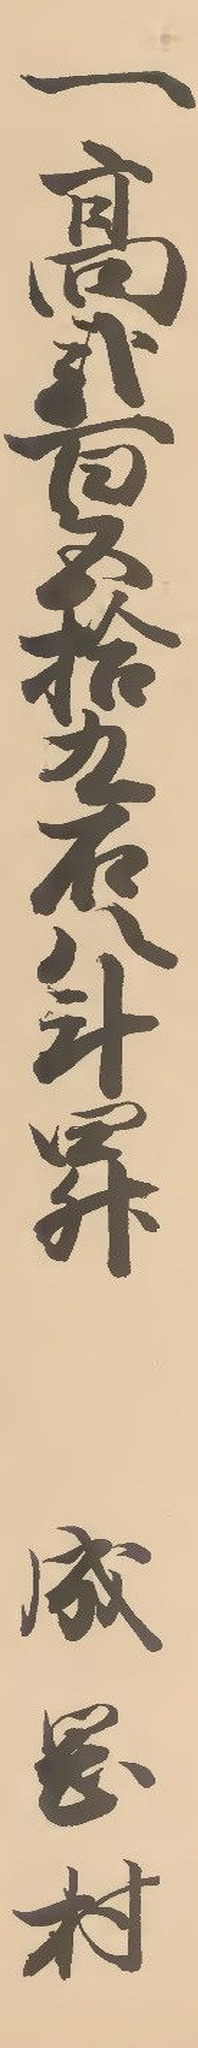一高弐百五拾九石八斗四升成岡村
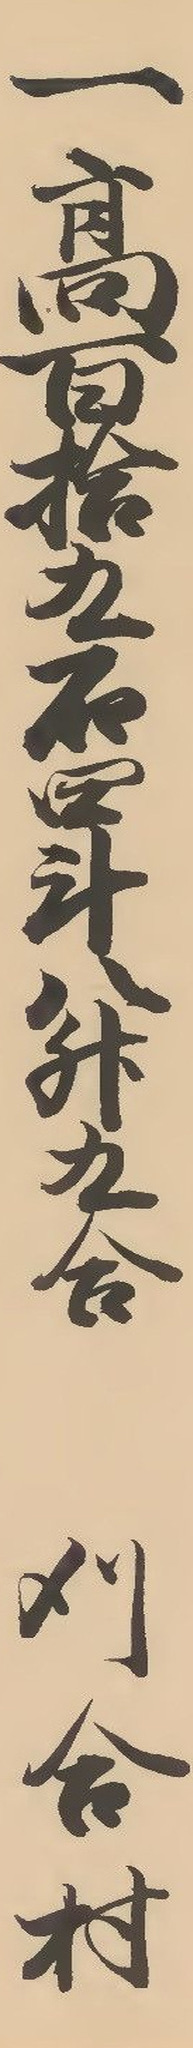一高百拾九石四斗八升九合刈合村
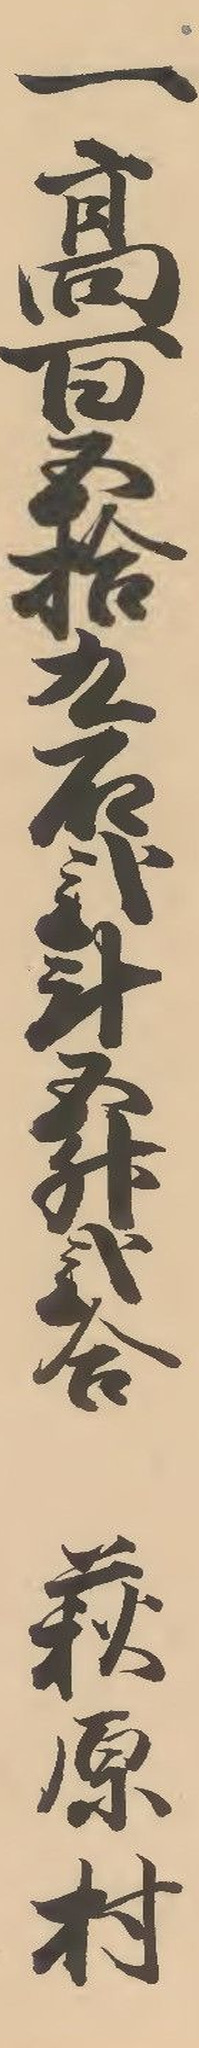一高百五拾九石弐斗五升弐合萩原村
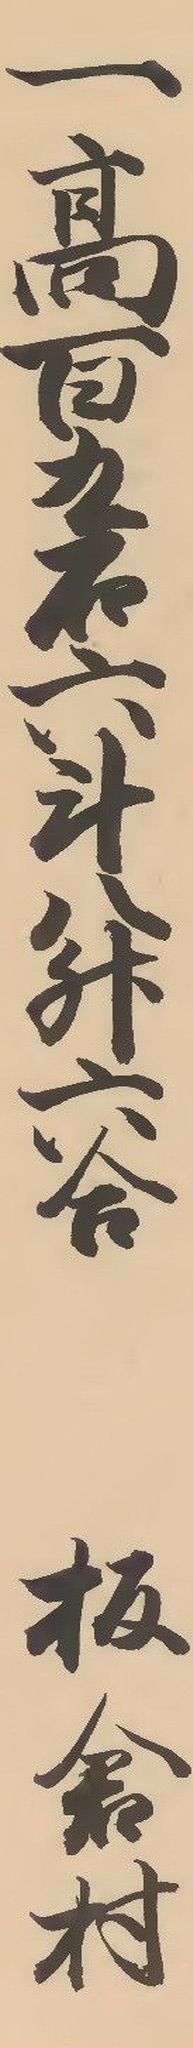一高百九石六斗八升六合板倉村

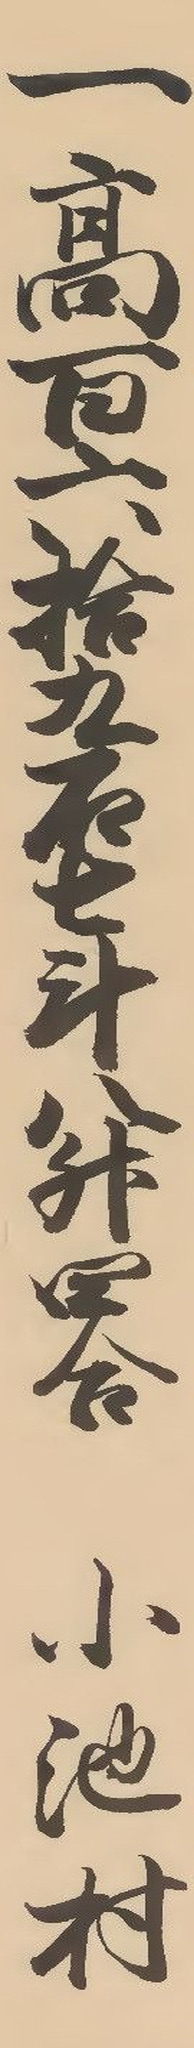一高百六拾九石七斗八升四合小池村
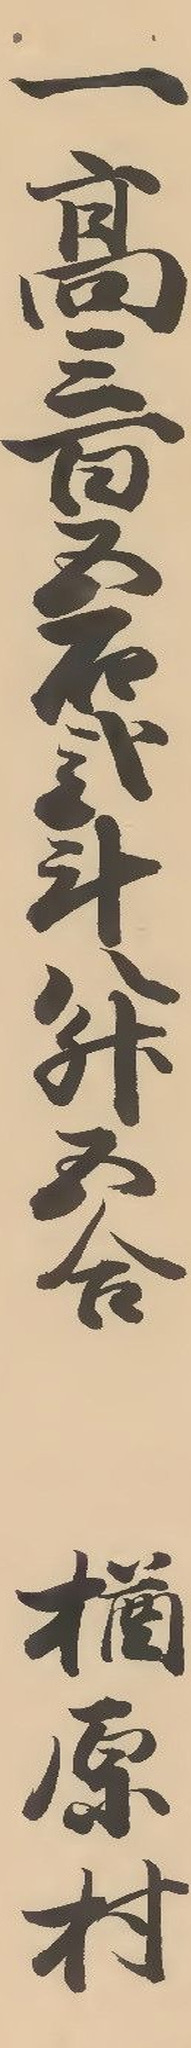一高三百五石弐斗八升五合楢原村
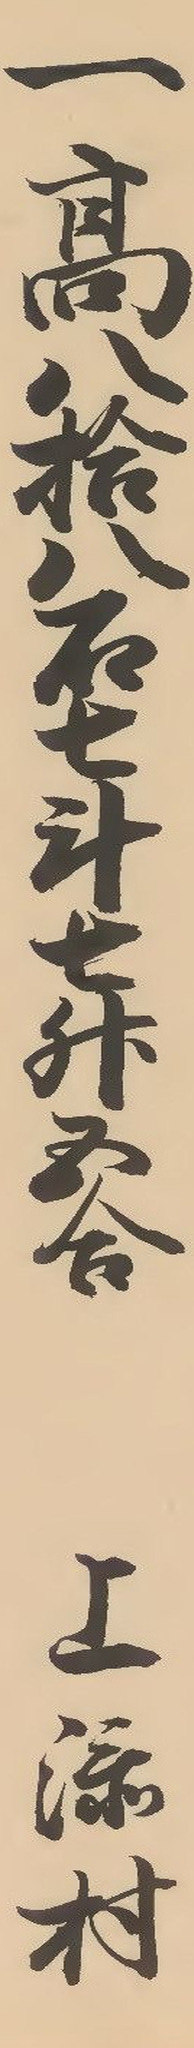一高八拾八石七斗七升五合上添村
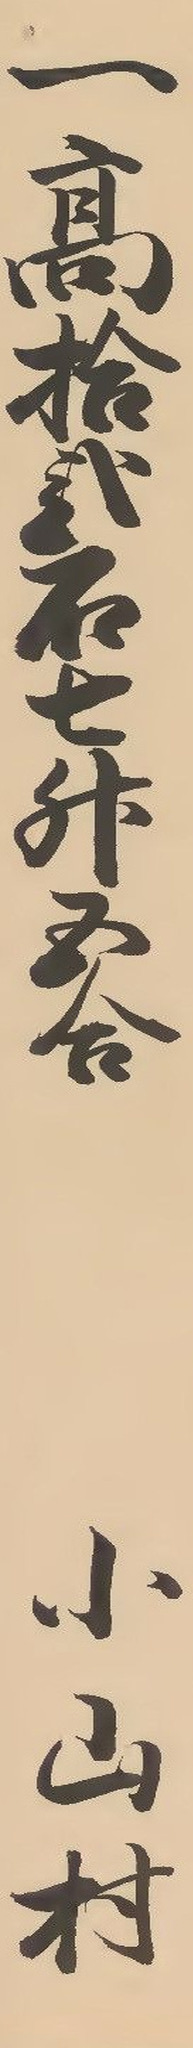一高拾弐石七升五合小山村
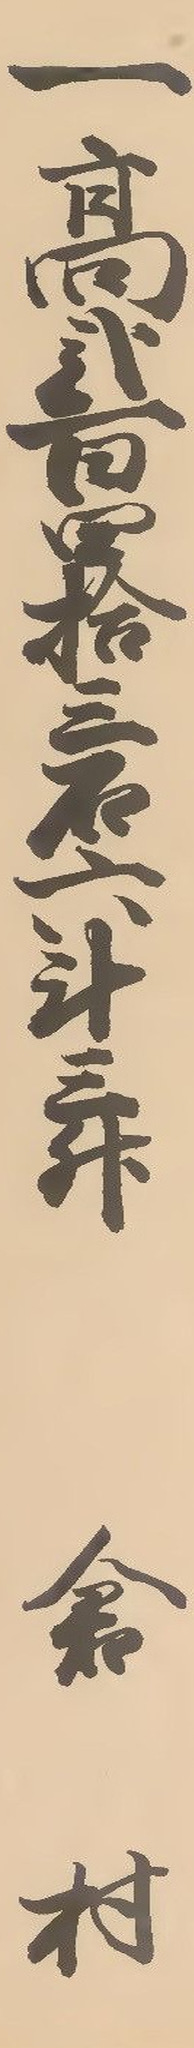一高弐百四拾三石六斗三升倉村
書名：陸奥国郷帳　１
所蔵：国立公文書館 National Archives of Japan
